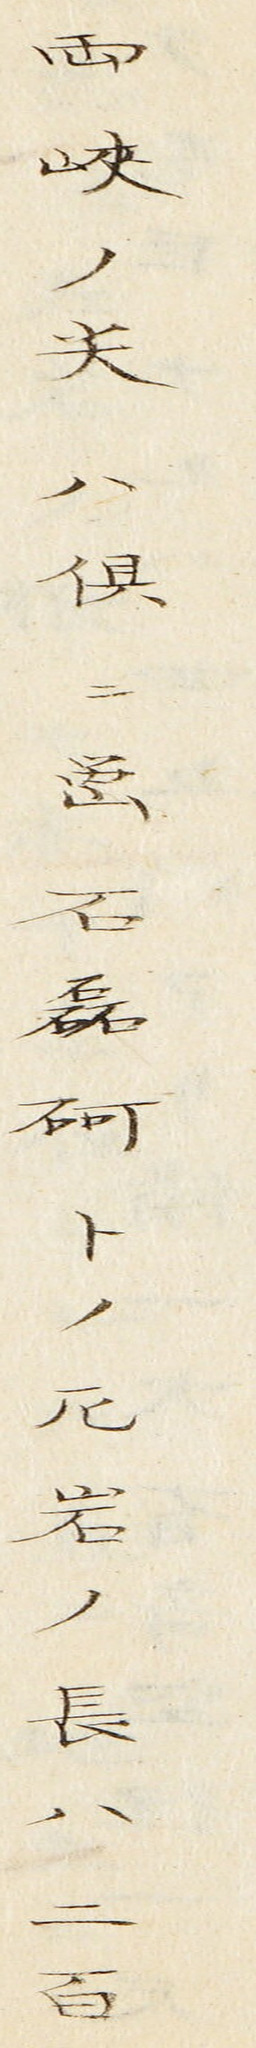両峡ノ尖ハ俱ニ嵒石磊砢トノ左岩ノ長ハ二百
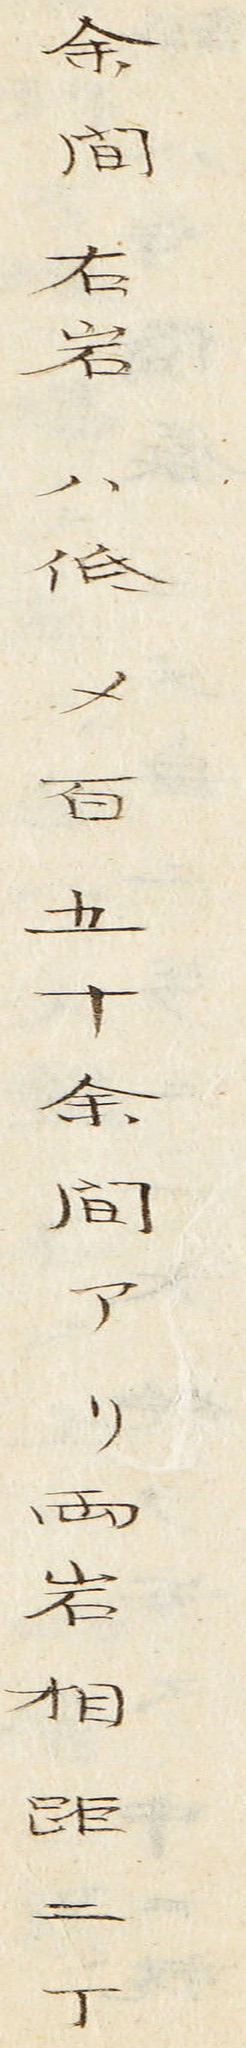余間右岩ハ低メ百五十余間アリ両岩相距二丁
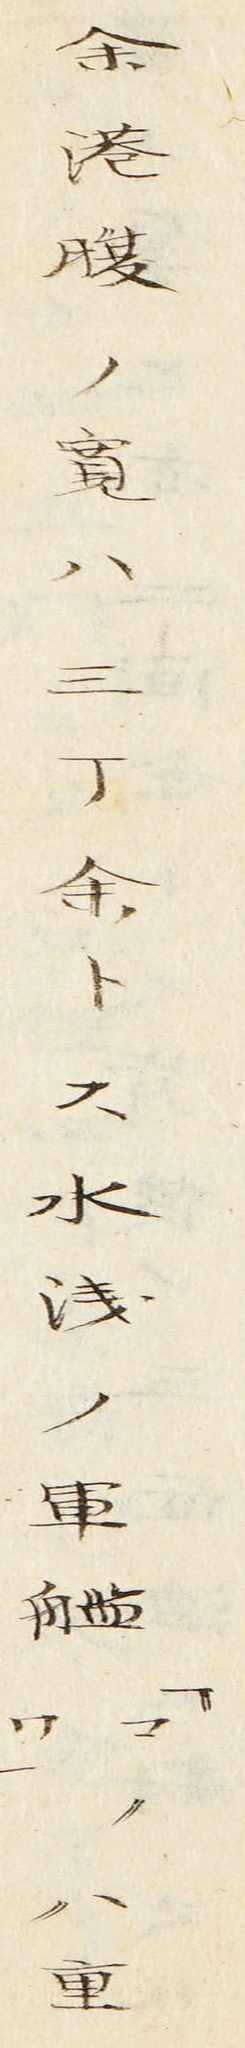余港腹ノ寛ハ三丁余トス水浅ノ軍艦「マノワ」ハ重
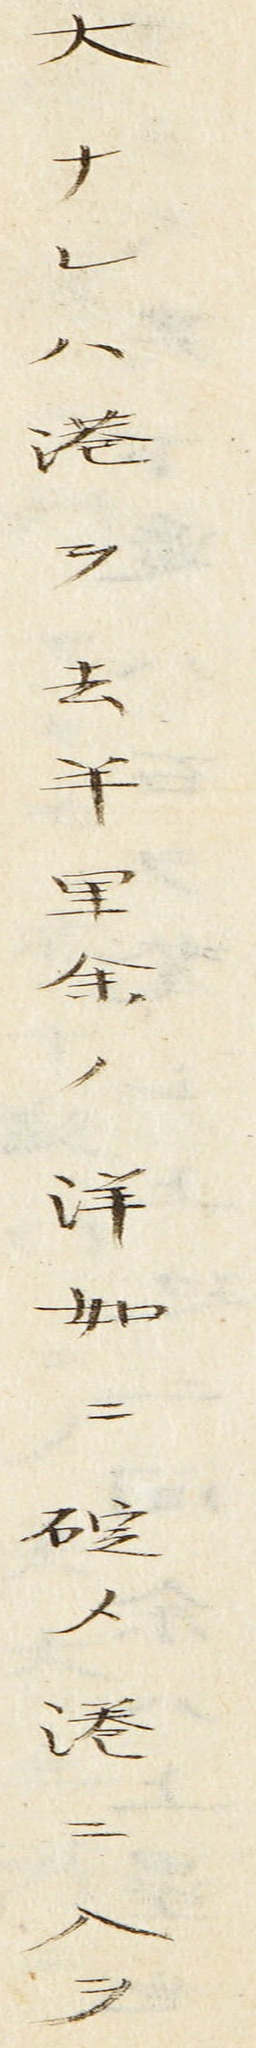大ナレハ港ヲ去半里余ノ洋如ニ碇シテ港ニ入ヲ
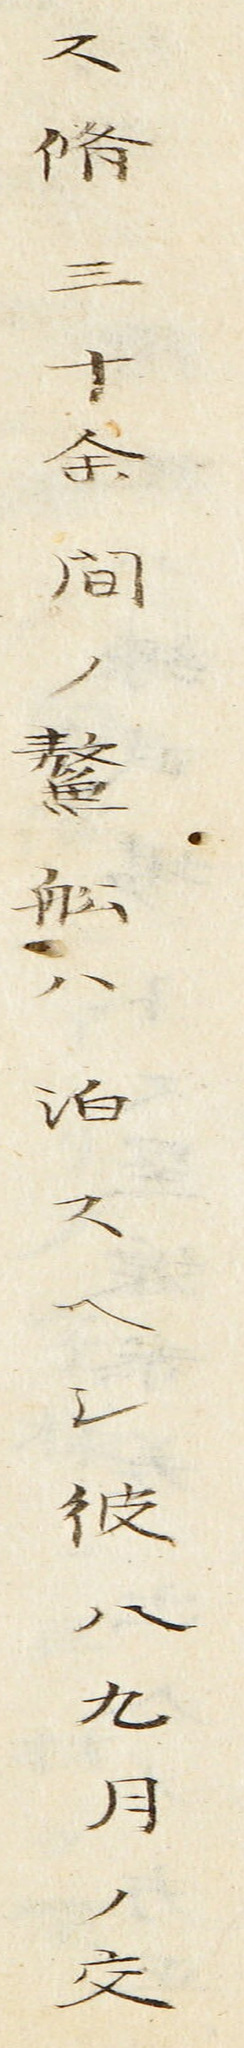ス修三十余間ノ鰲船ハ泊スヘシ彼八九月ノ交
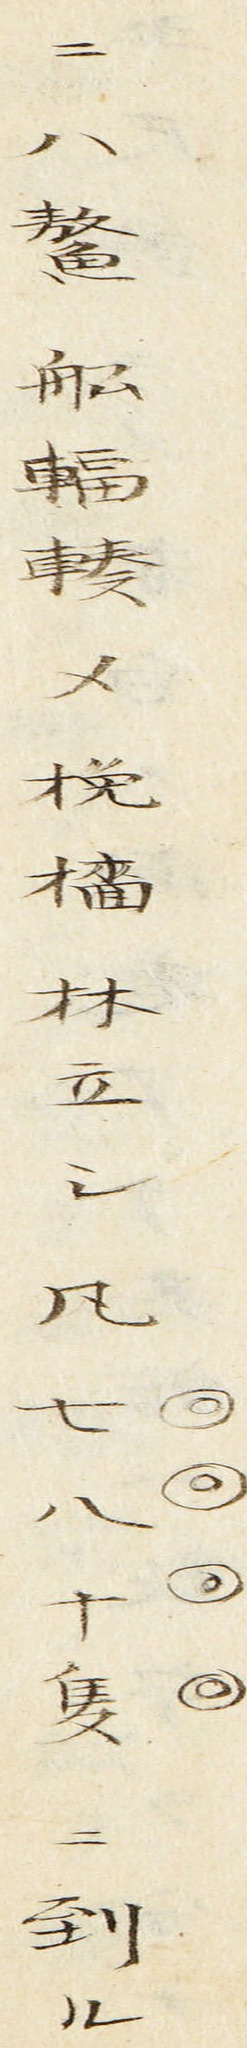ニハ鰲船輻輳シテ梚檣林立シ凡七八十隻ニ到ル
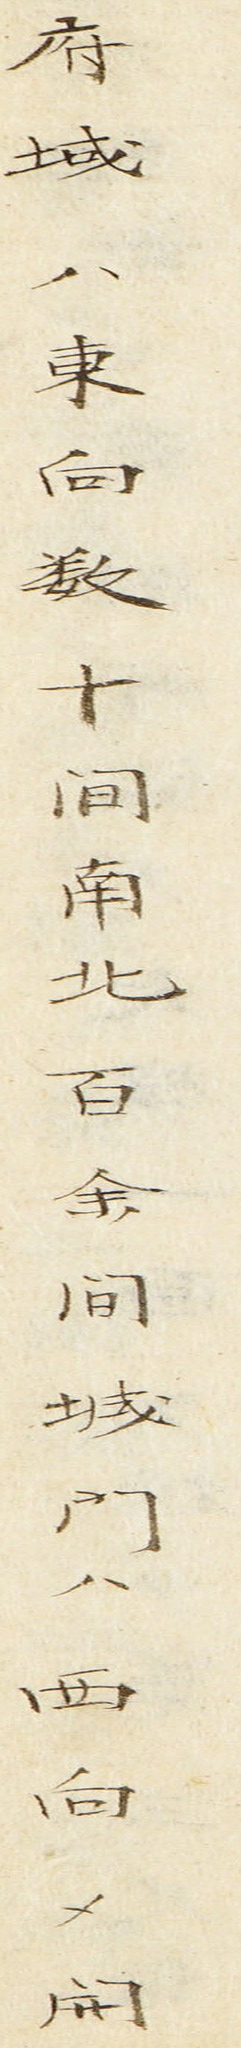府域ハ東向数十間南北百余間城門ハ西向シテ開

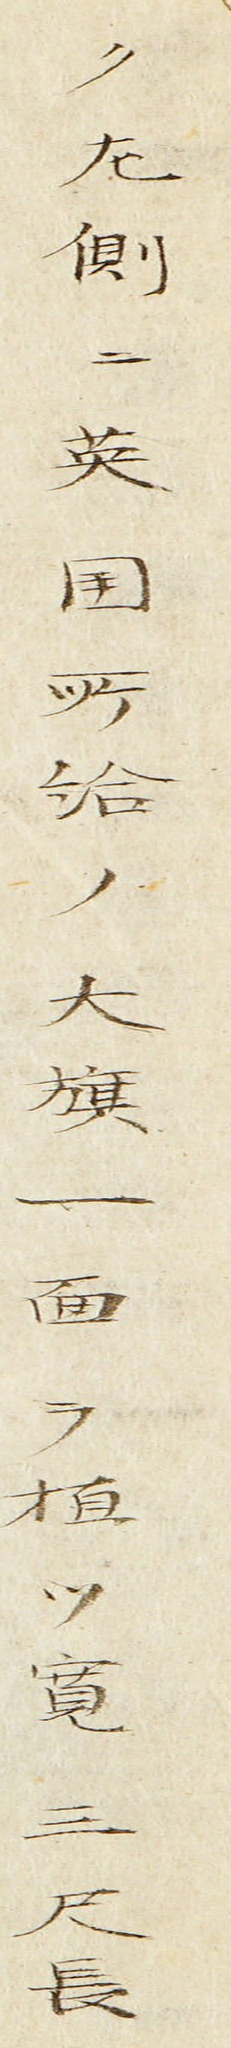ク左側ニ英国所給ノ大旗一面ヲ植ツ寛三尺長
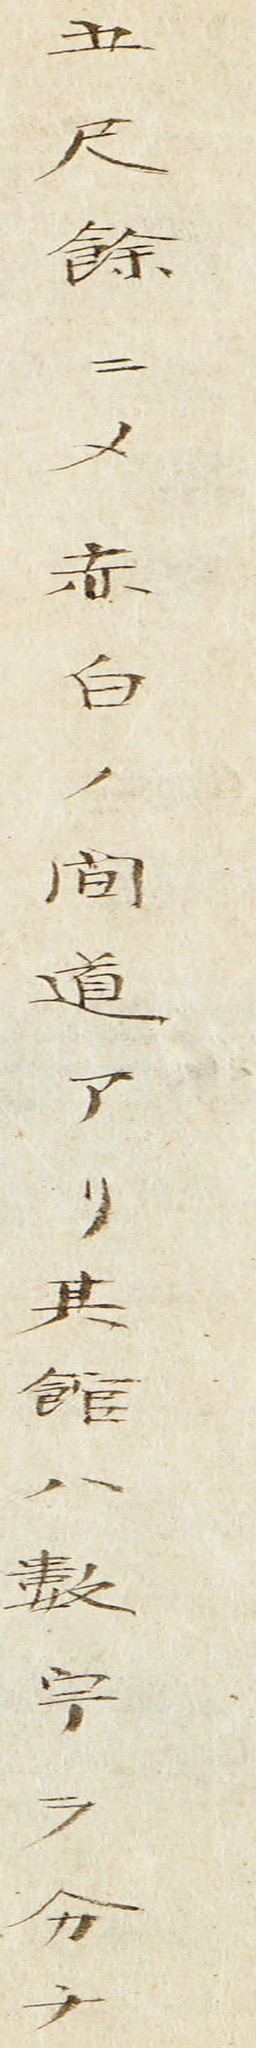五尺余ニシテ赤白ノ間道アリ其館ハ数𡧃ヲ分チ
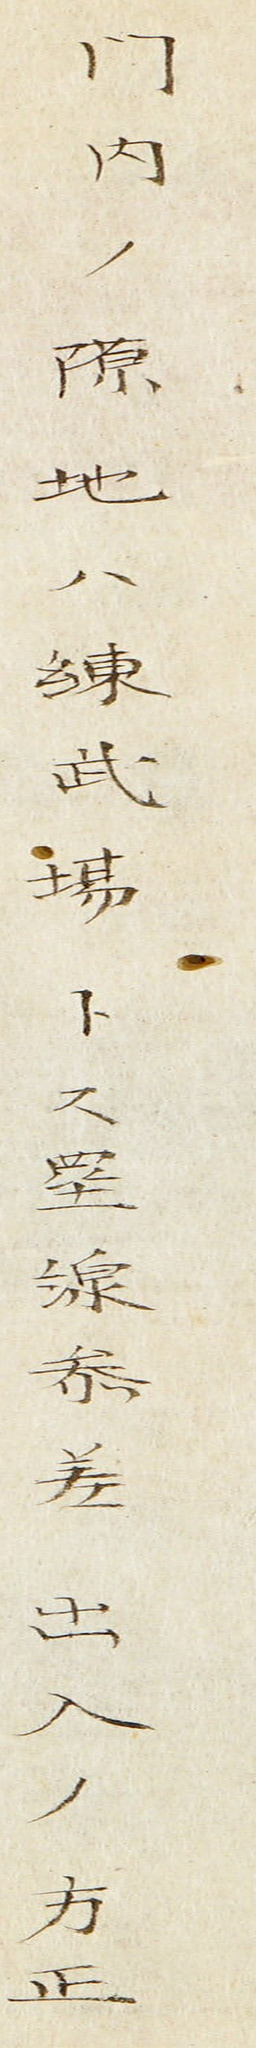門内ノ隙地ハ練武場トス塁線𠫵差出入ノ方正
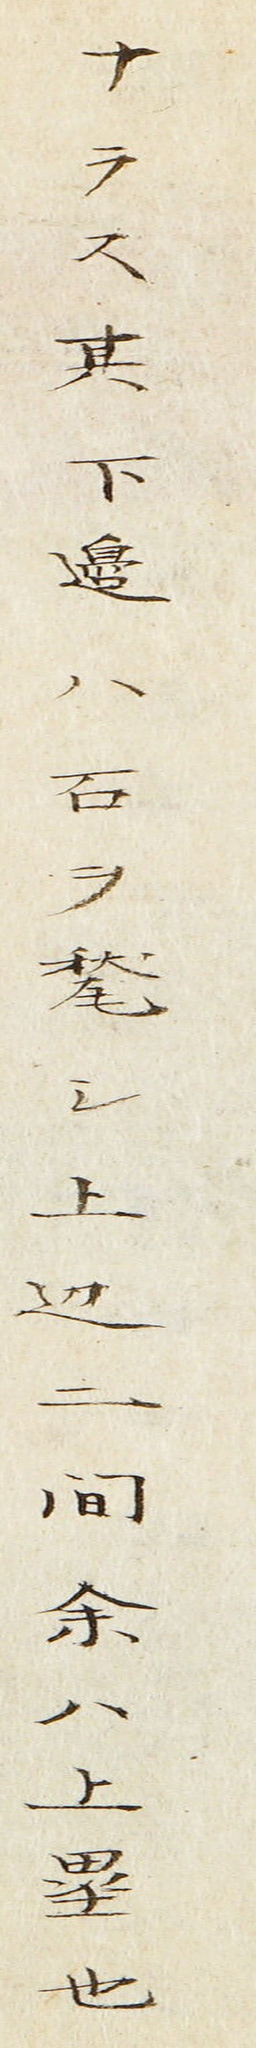ナラス其下辺ハ石ヲ甃シ上辺二間余ハ上塁也
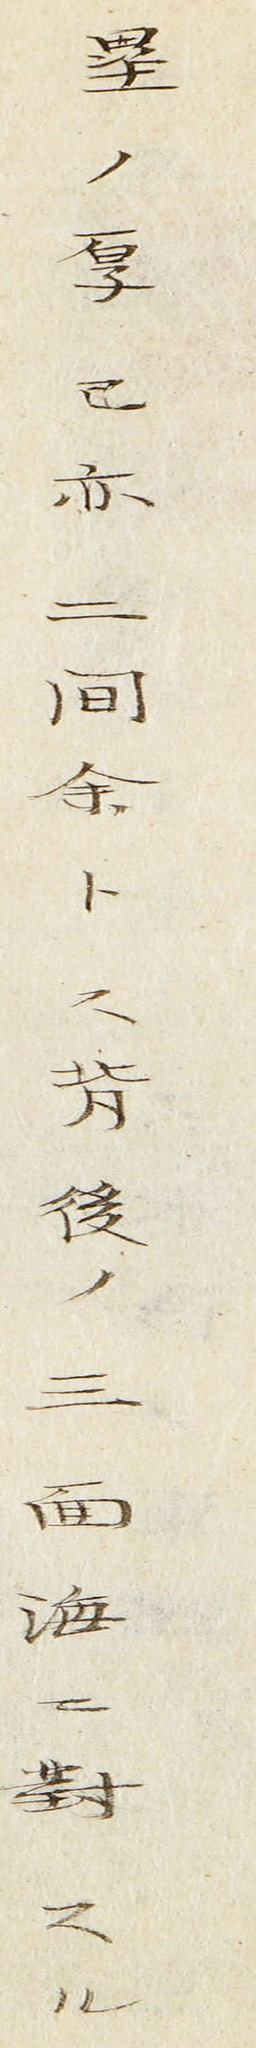塁ノ厚モ亦二間余トス背後ノ三面海ニ対スル
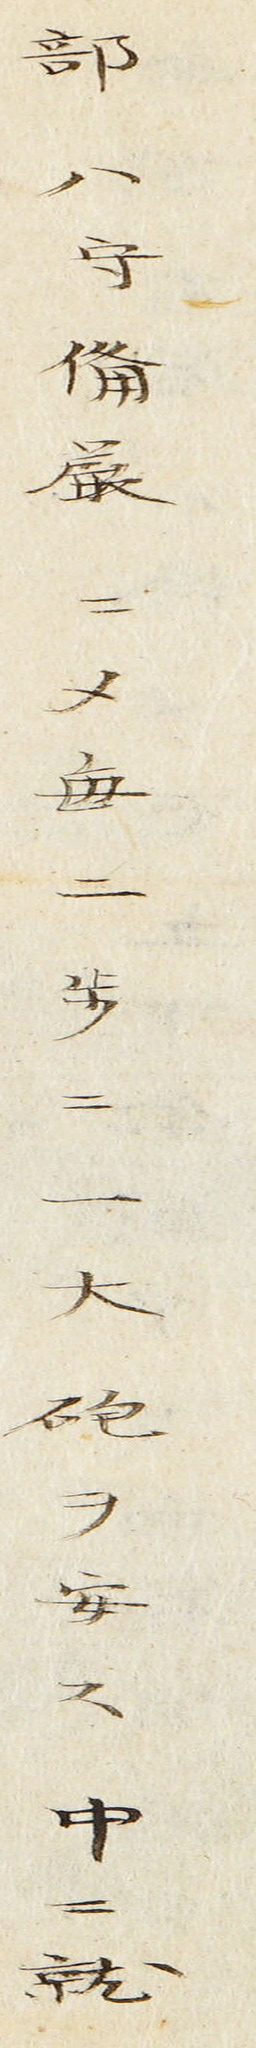部ハ守備厳ニシテ毎ニ歩ニ一大砲ヲ安ス中ニ就
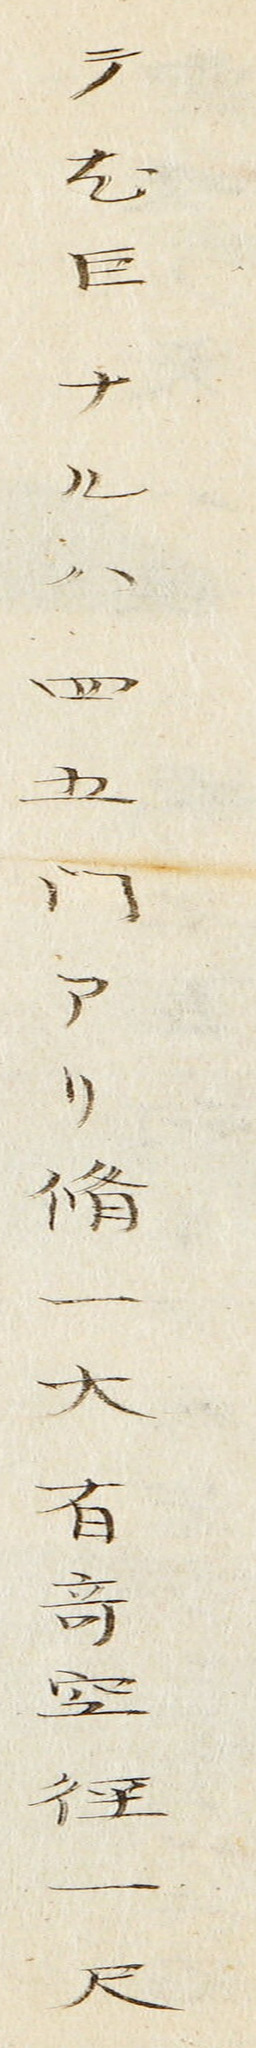テ尤巨ナルハ四五門アリ修一大有奇空径一尺
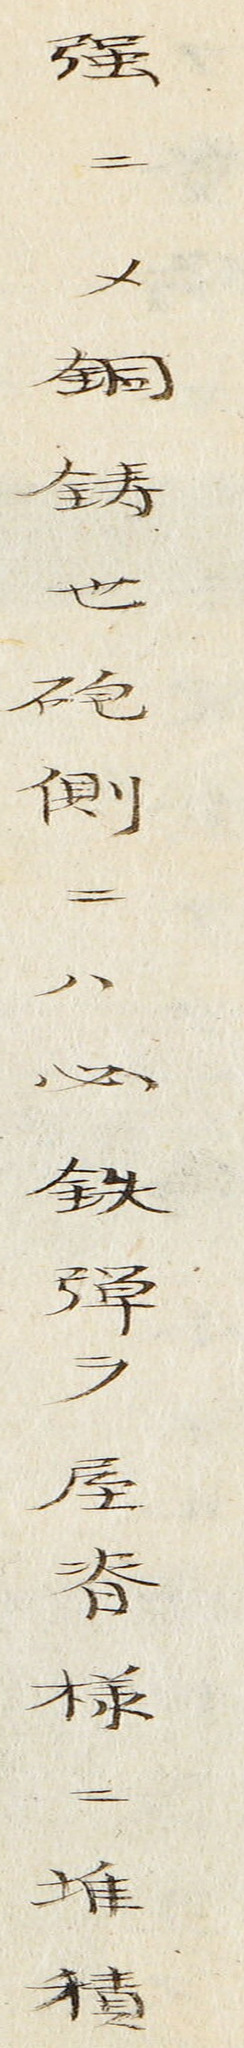強ニシテ銅鋳也砲側ニハ必鉄弾ヲ屋脊様ニ堆積
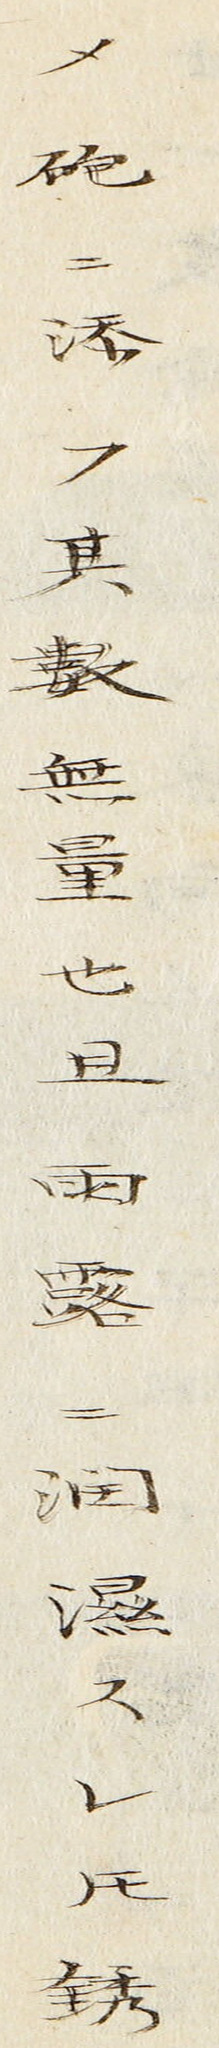シテ砲ニ添フ其数無量也且雨露ニ潤湿スレトモ銹
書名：流蕃通書
